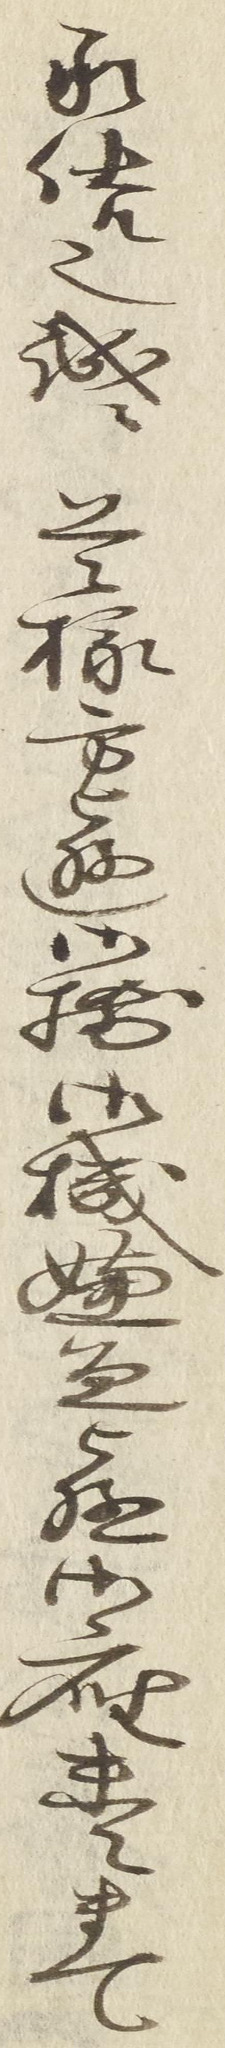承仕候也誠に上々様方被遊御揃御機嫌兼被遊御座末々まで
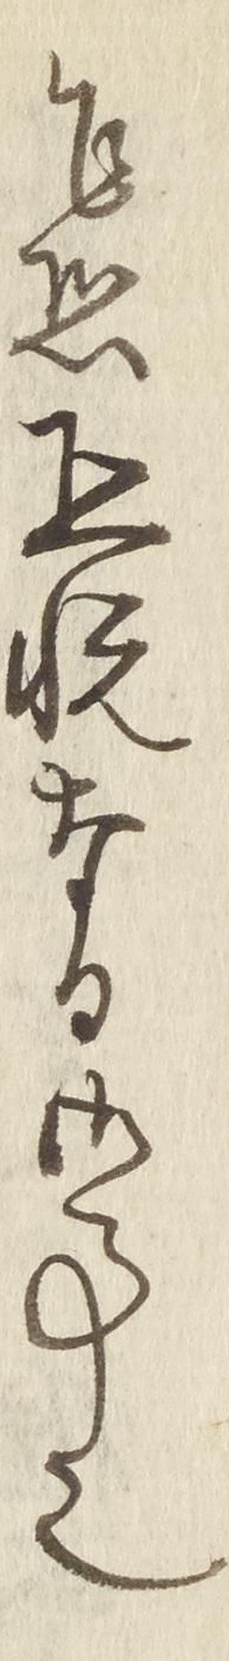乍恐恐悦なる御事也
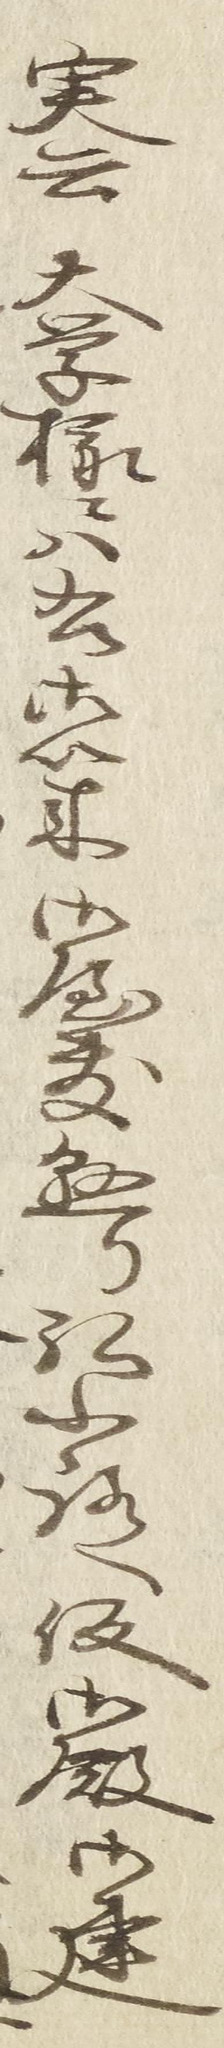実云大学様には右御以来御屋敷懸り弘小路へ仮御殿御建
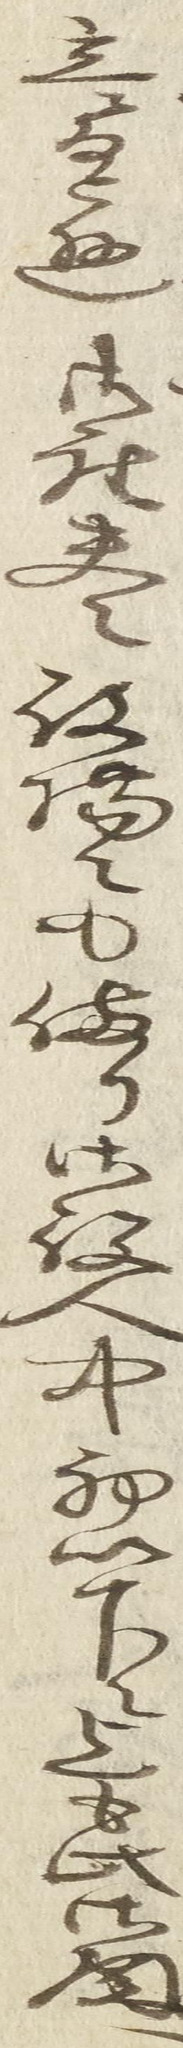立にて被遊御座夫々役場にも備り御役人中初以下々迄も此御殿へ
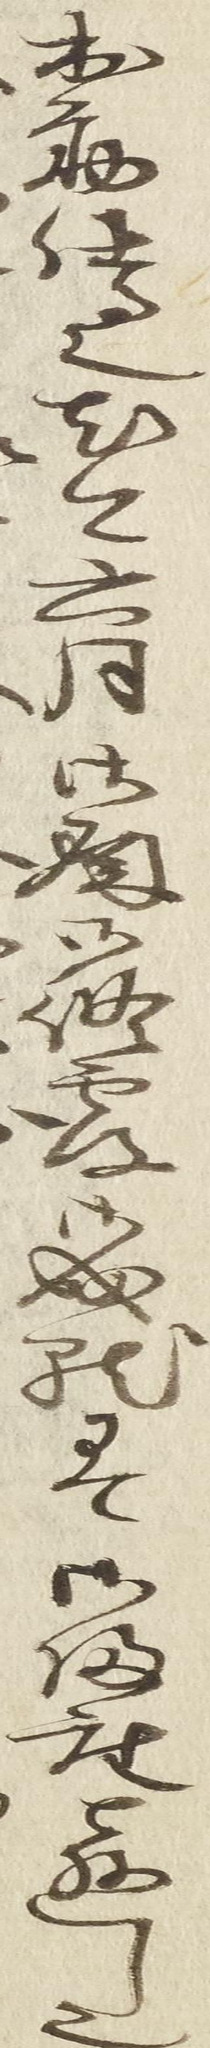出勤仕る也尤今六月御殿御修覆御成就にて御帰座被遊し也
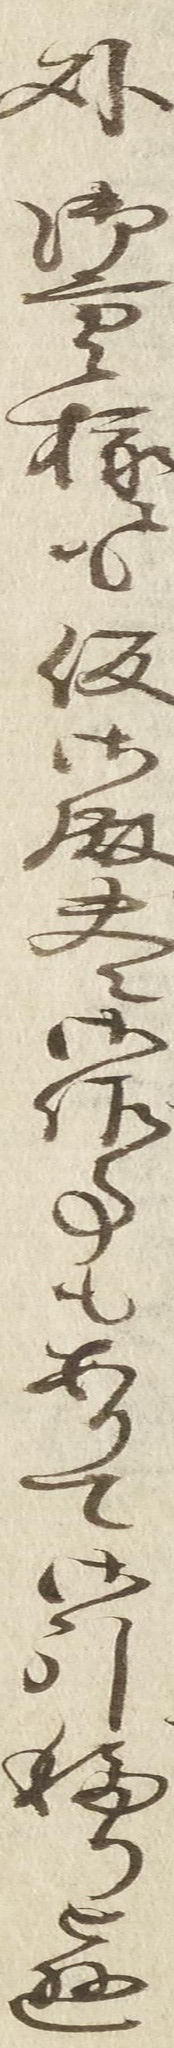外御方々様にも仮御殿夫々御作事もありて御引移り被遊
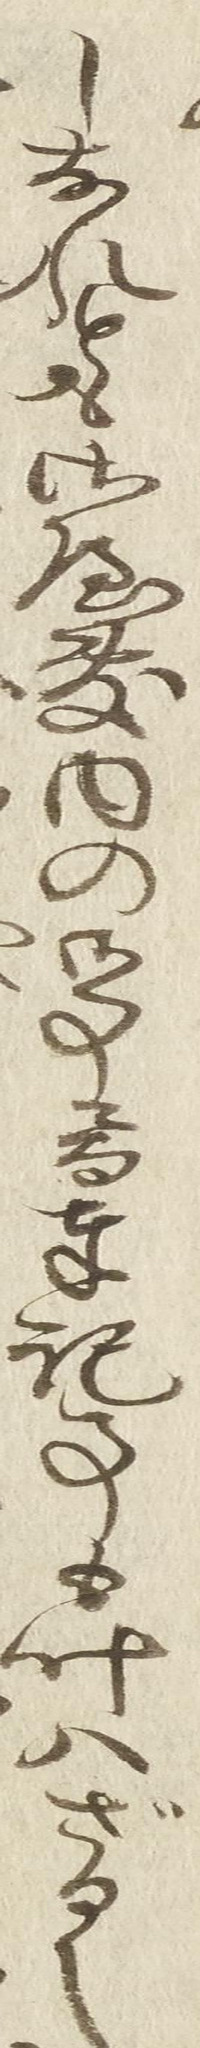しなれとも御屋敷内の御事にて奉記事も叶ざる也
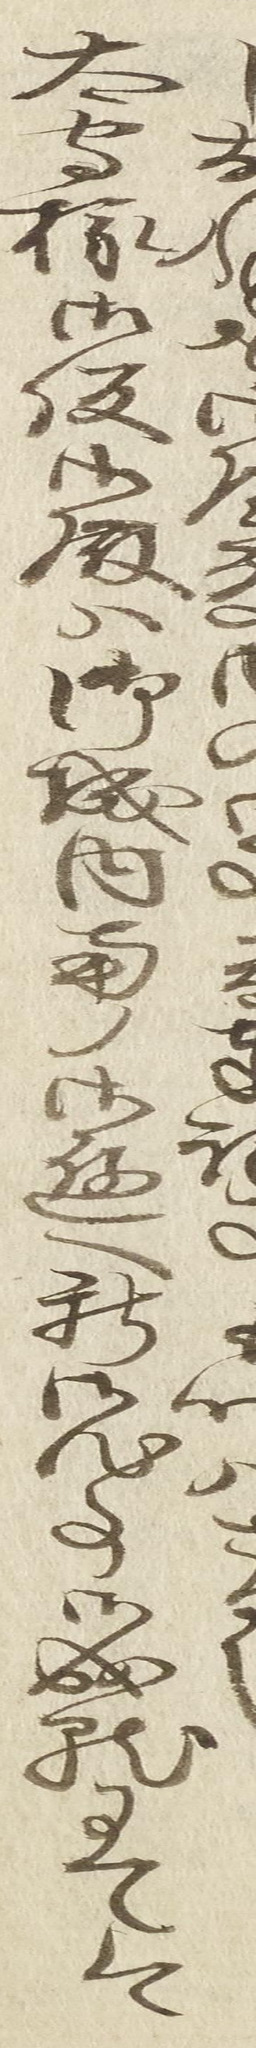太守様御仮御殿は御城内南の御庭へ新御作事御成就にて今
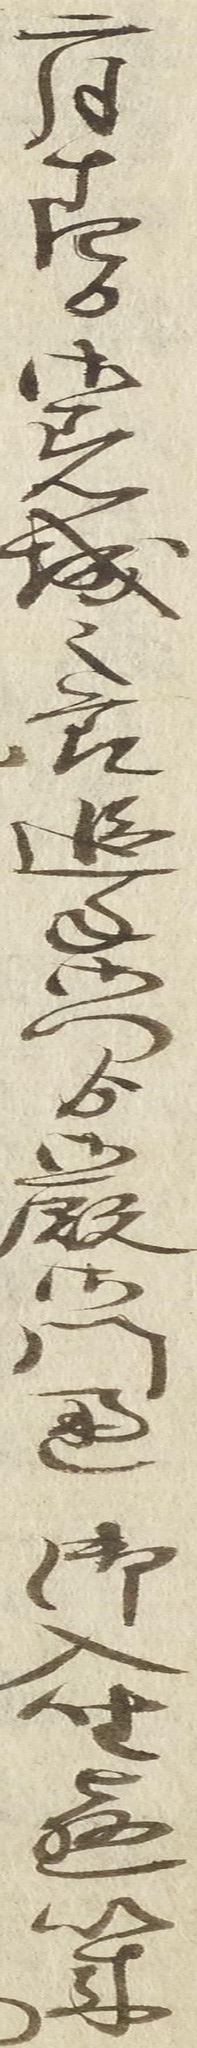二月十四日御着城之節追手御門より御厩御門通御入座被遊以来
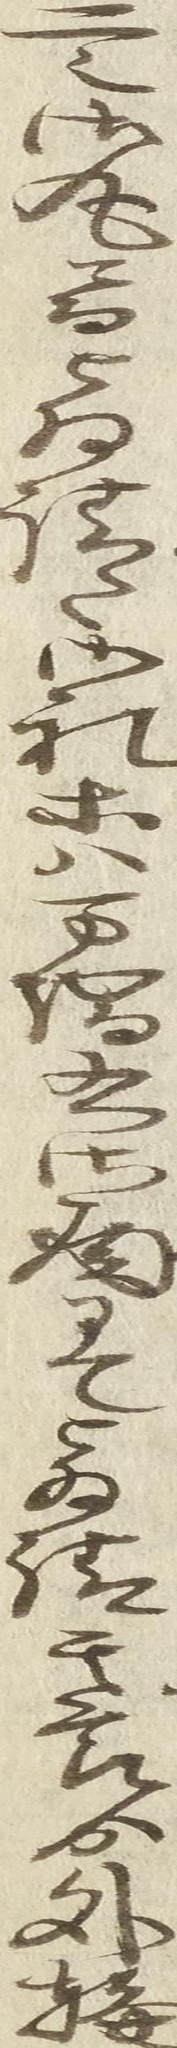二之御丸にて被為請候御礼等は万端右御殿にて被為請其節より外輪
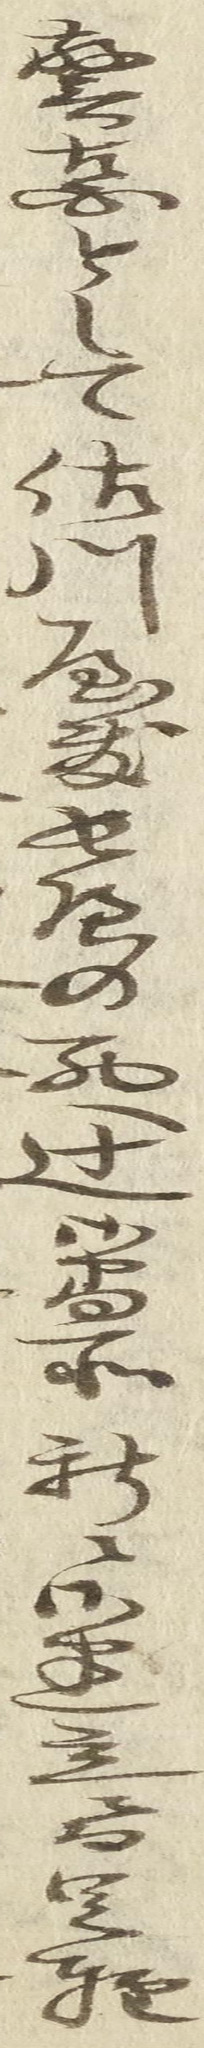警固として佐川屋敷長屋の西へ辻御番所新に御建立にて足軽
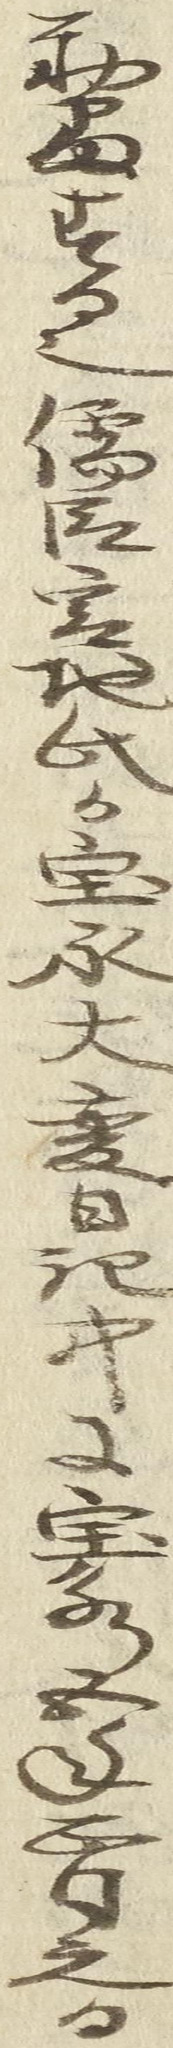勤番する也儒臣宮地氏か宝永大変日記中に宝永五年正月元日
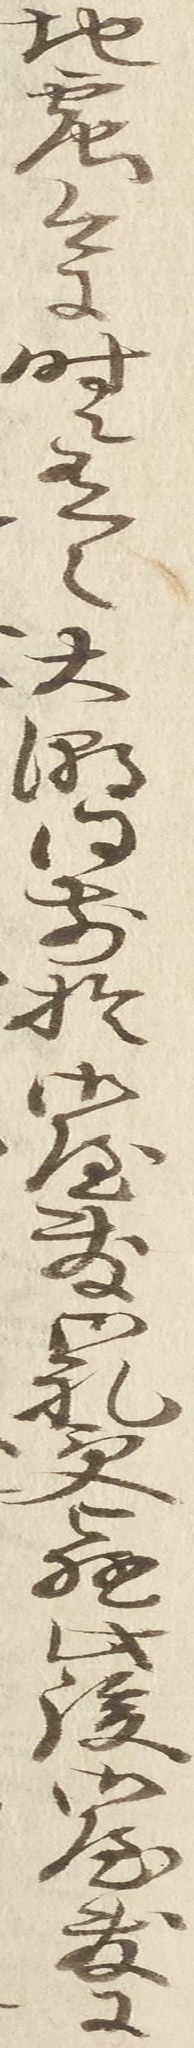地震今に時々有之大潮同然於御屋敷御礼受被遊此後御屋敷に
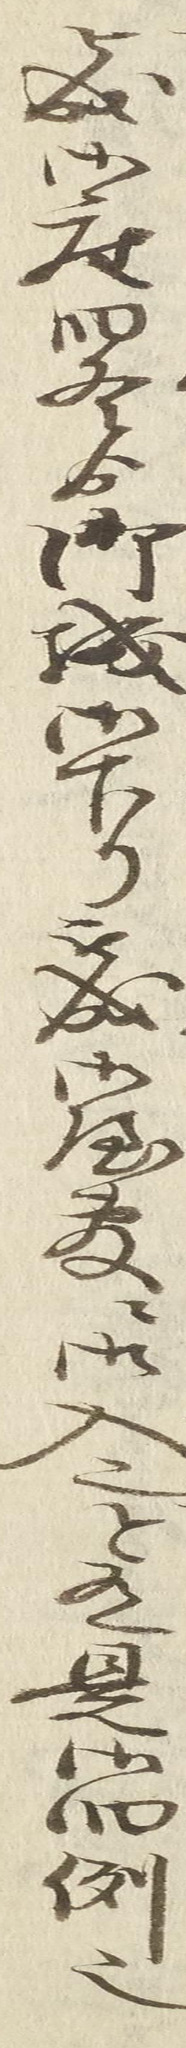被成御座旧冬より御城御下り被成御屋敷に御入也と有是御旧例也
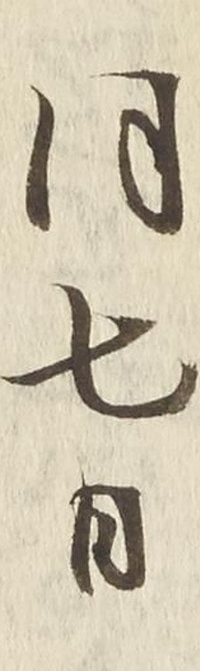同七日
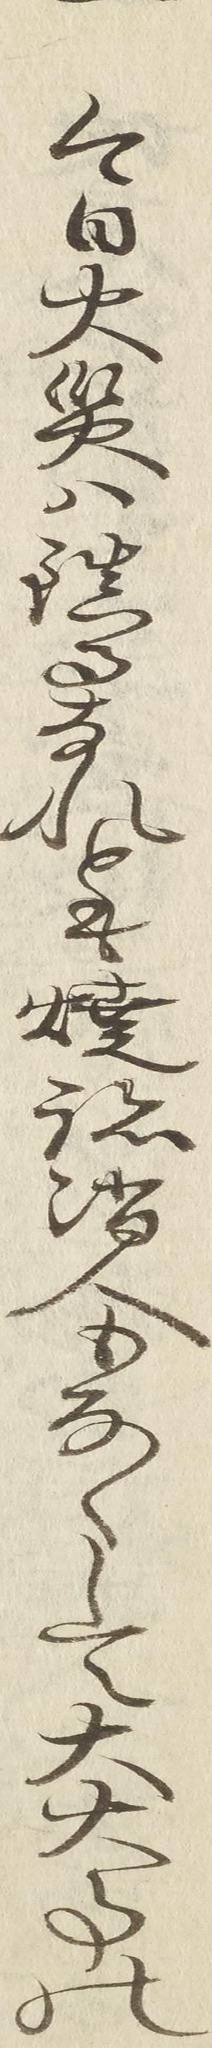一今日火災は鎮るなれとも焼跡消人もなくして大火事の
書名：地震記　上
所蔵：東京大学地震研究所図書室 Earthquake Research Institute Library, The University of Tokyo, JAPAN
